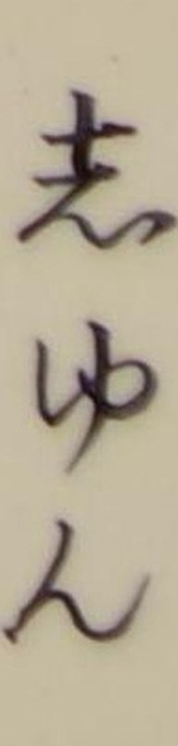しゆん
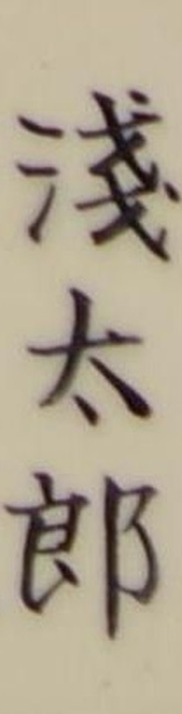浅太郎
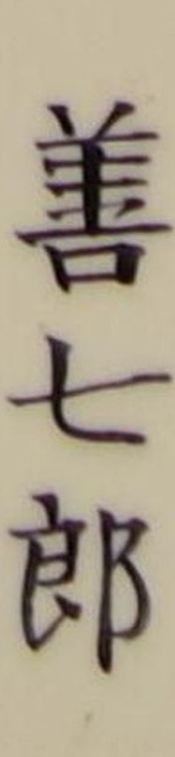善七郎
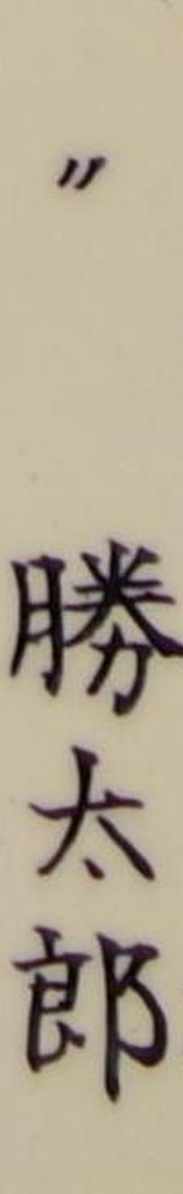勝太郎
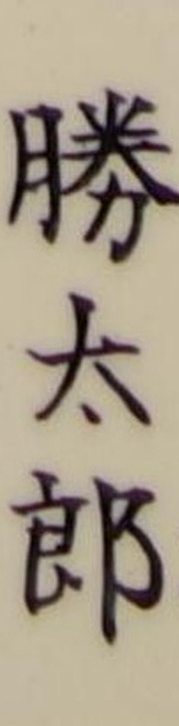勝太郎
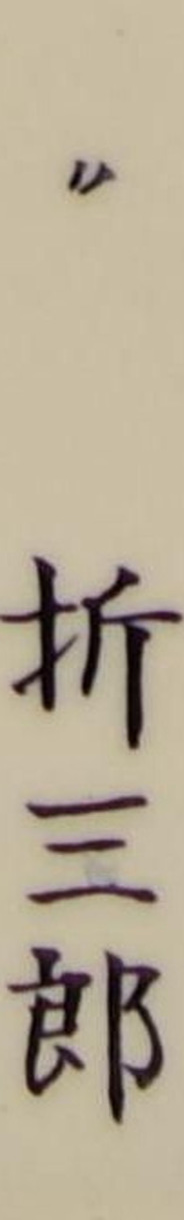折三郎
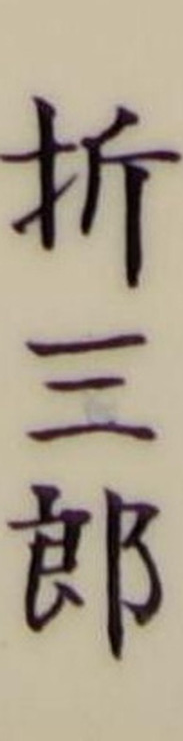折三郎
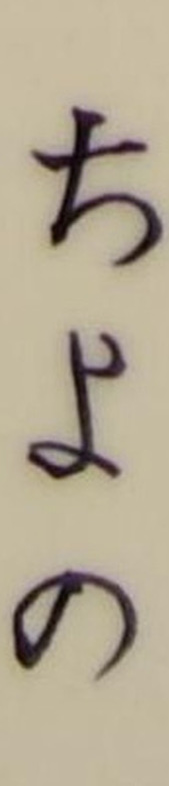ちよの
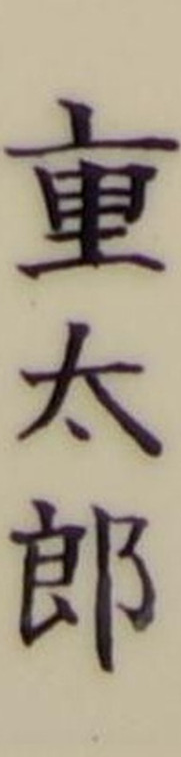重太郎
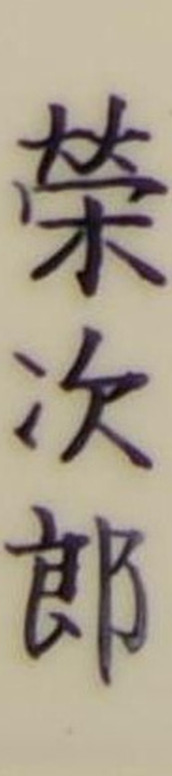瀧次郎

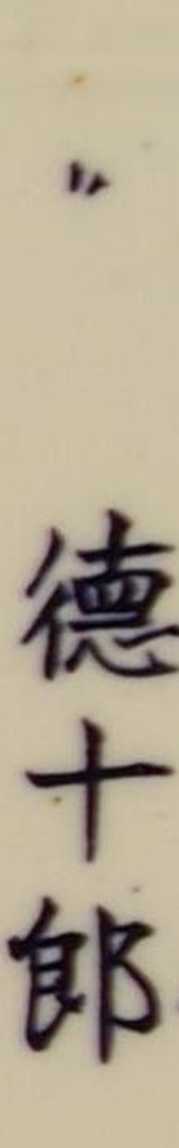徳十郎
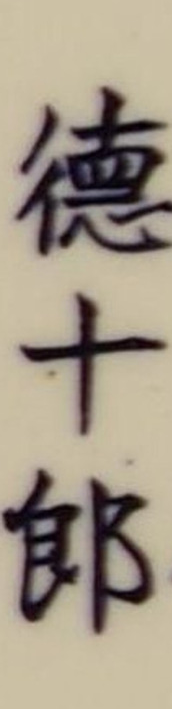徳十郎
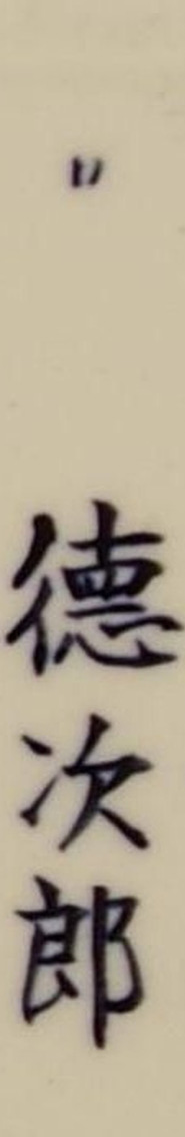徳次郎
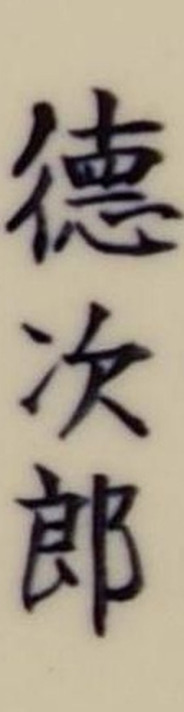徳次郎
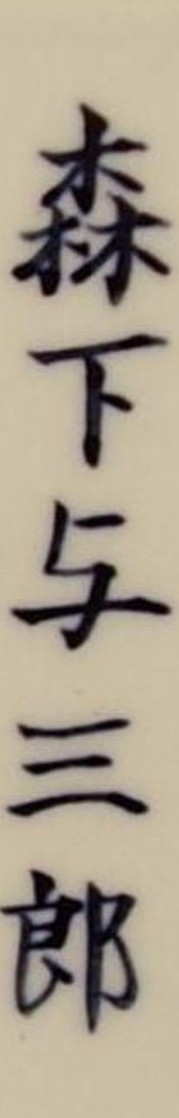森下与三郎
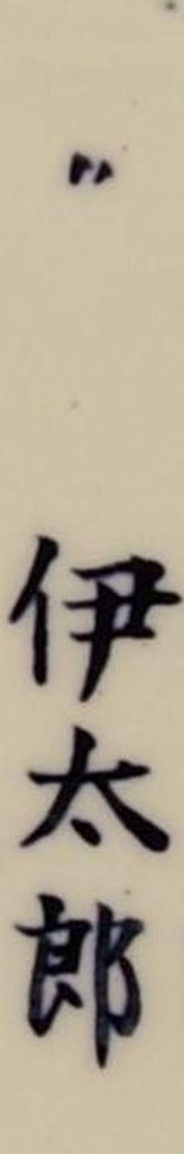伊太郎
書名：A~D
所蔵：koyasan kongobuji
